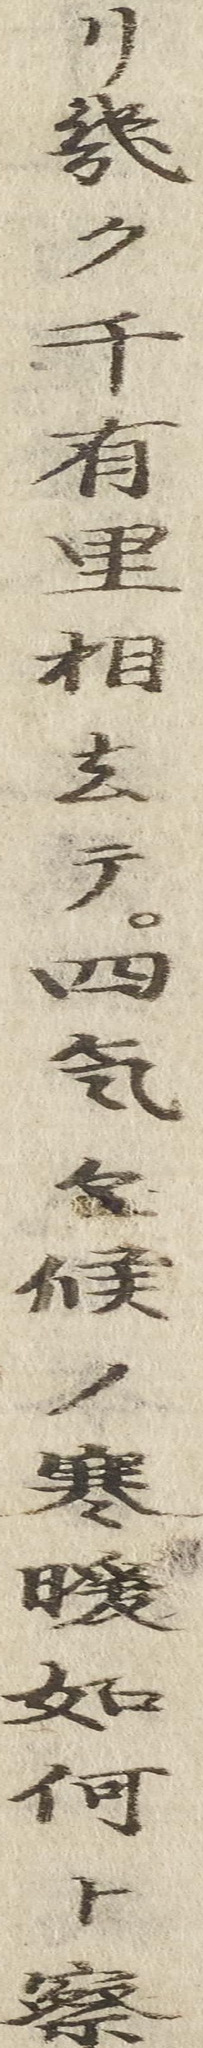リ幾ク千有里相玄テ。四気々候ノ寒暖如何ト察
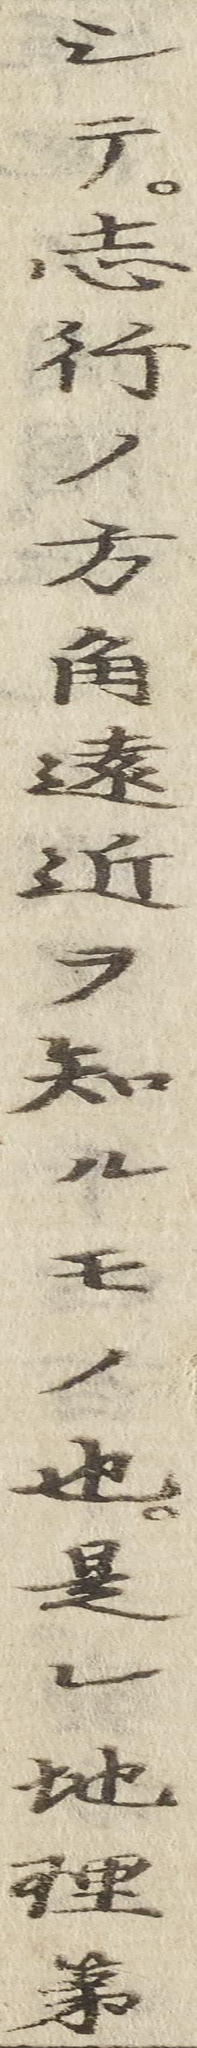シテ。志行ノ方角遠近ヲ知ルモノ也。是レ地理第
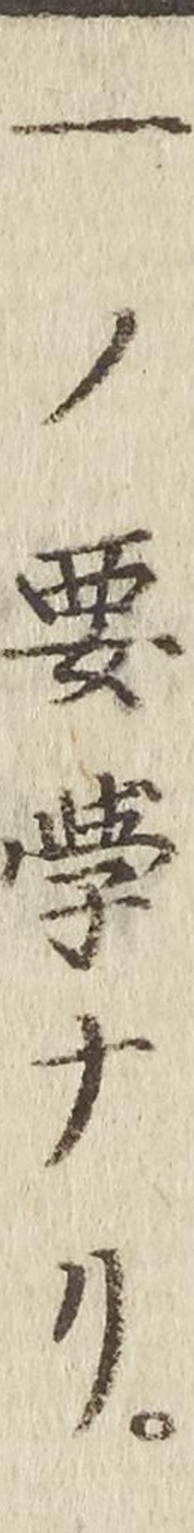一ノ要学ナリ。
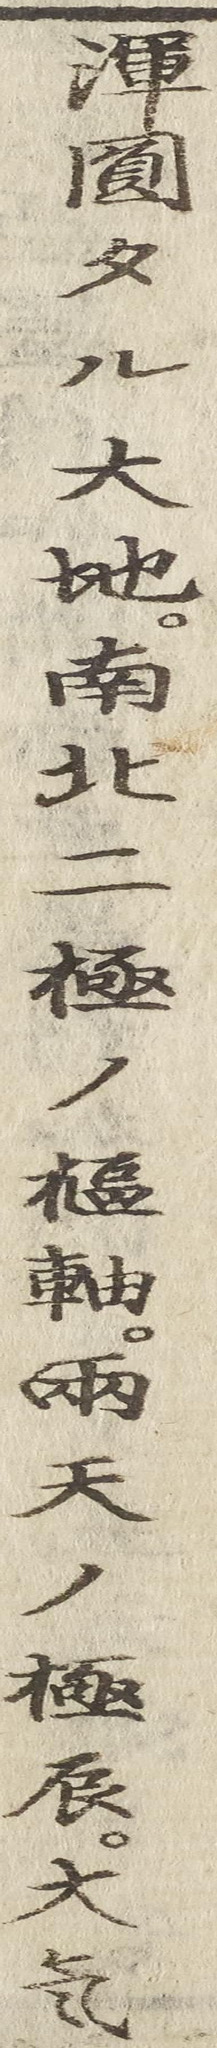渾円タル大地。南北二極ノ枢軸。両天ノ極辰。大気
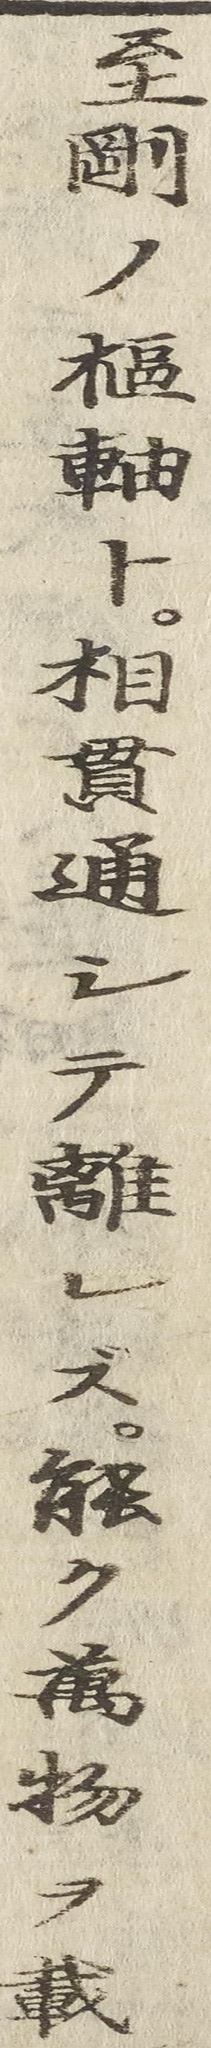至剛ノ枢軸ト。相貫通シテ離レズ。能ク万物ヲ載
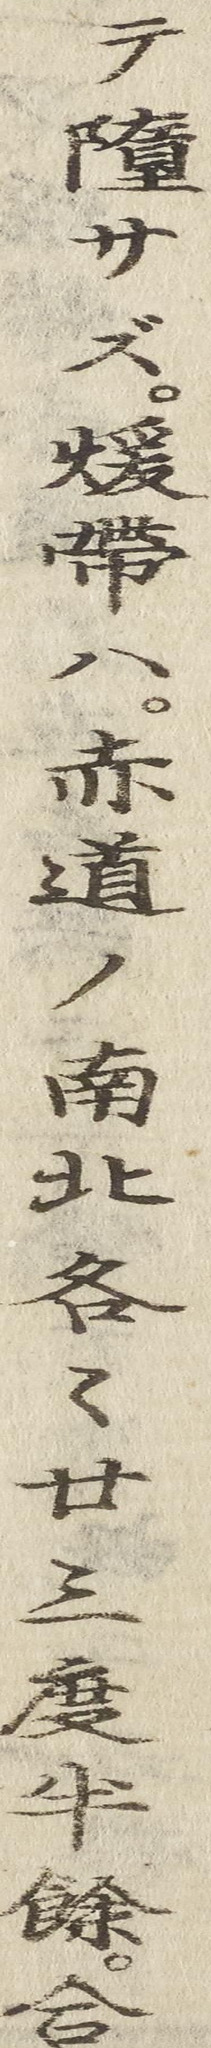テ墮サズ。煖帯ハ。赤道ノ南北各々廿三度半余。合
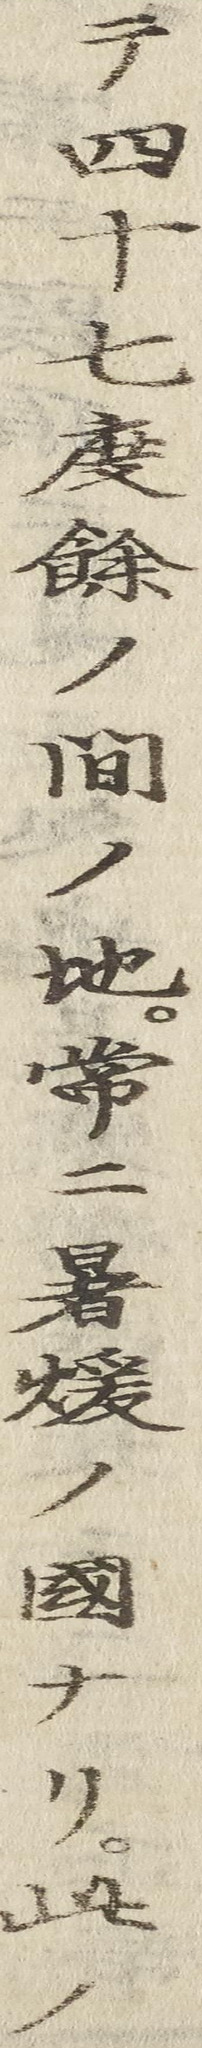テ四十七度余ノ間ノ地。帯ニ暑煖ノ国ナリ。此ノ
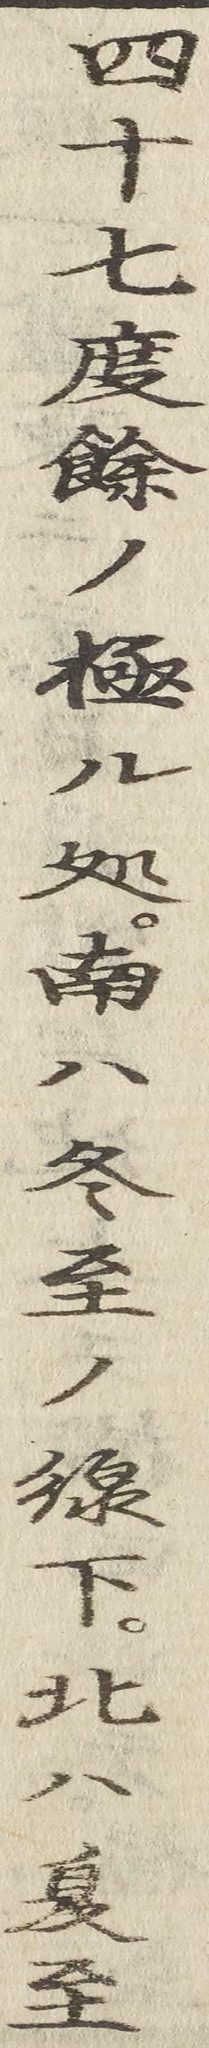四十七度余ノ極ル処。南ハ冬至ノ線下。北ハ夏至
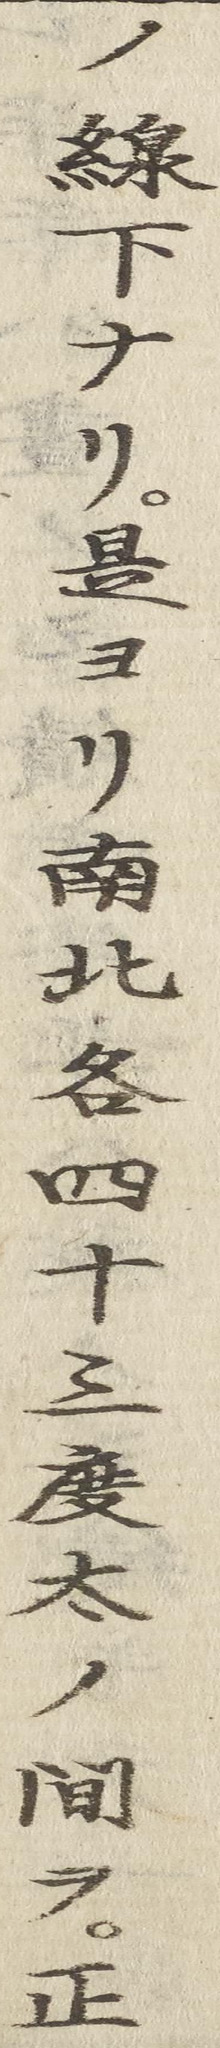ノ線下ナリ。是ヨリ南北各四十三度太ノ間ヲ。正
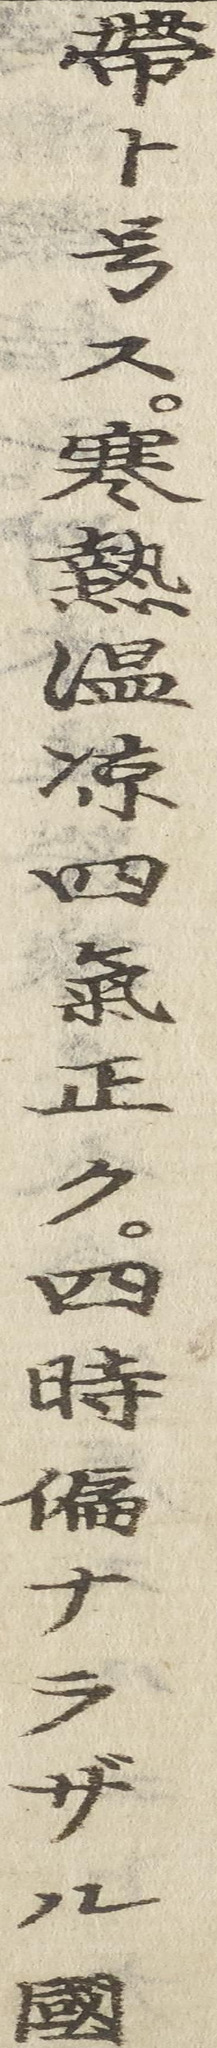帯ト号ス。寒熱温涼四気正ク。四時偏ナラザル国
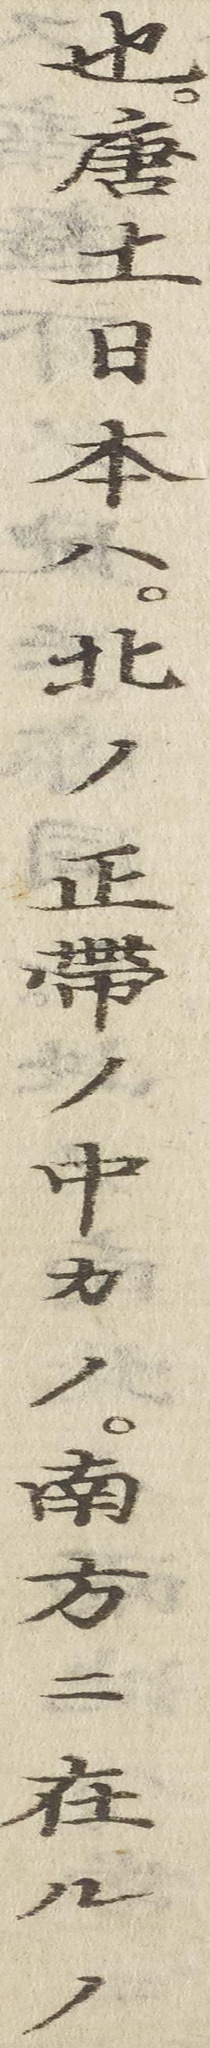也。唐土日本ハ。北ノ正帯ノ中カノ。南方ニ在ルノ
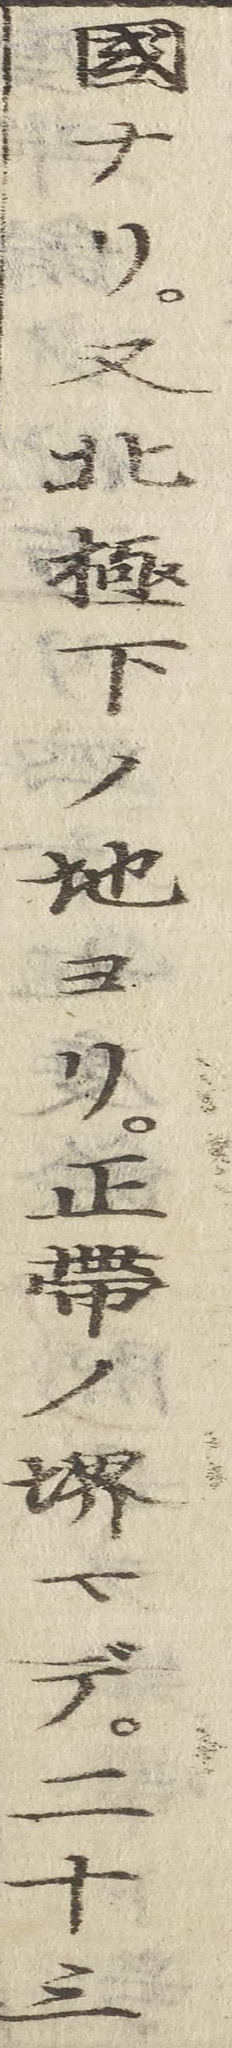国ナリ。又北極下ノ地ヨリ。正帯ノ堺マデ。二十三

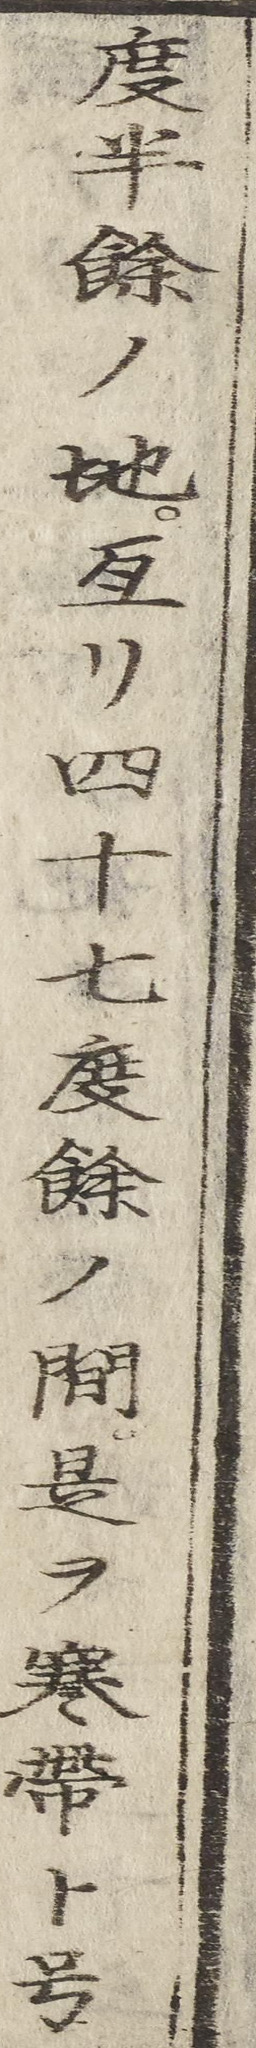度半余ノ地。亙リ四十七度余ノ間是ヲ寒帯ト号
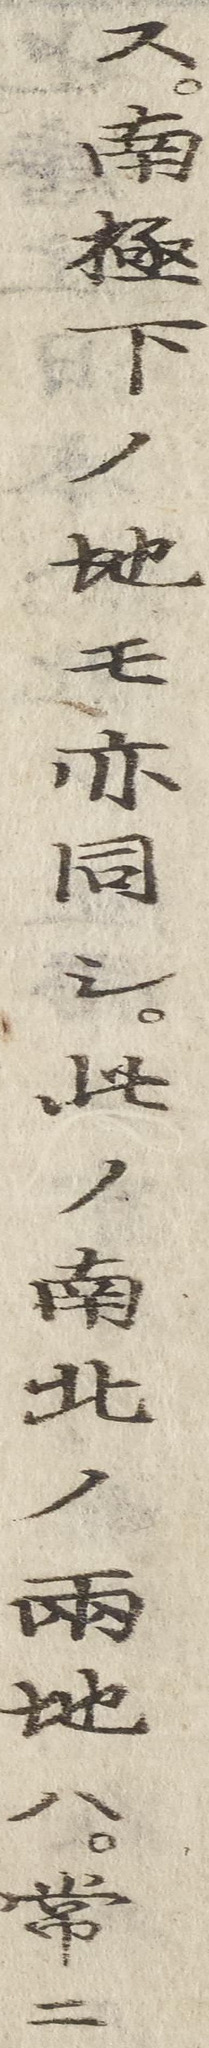ス。南極下ノ地モ亦同シ。此ノ南北ノ両地ハ。常ニ
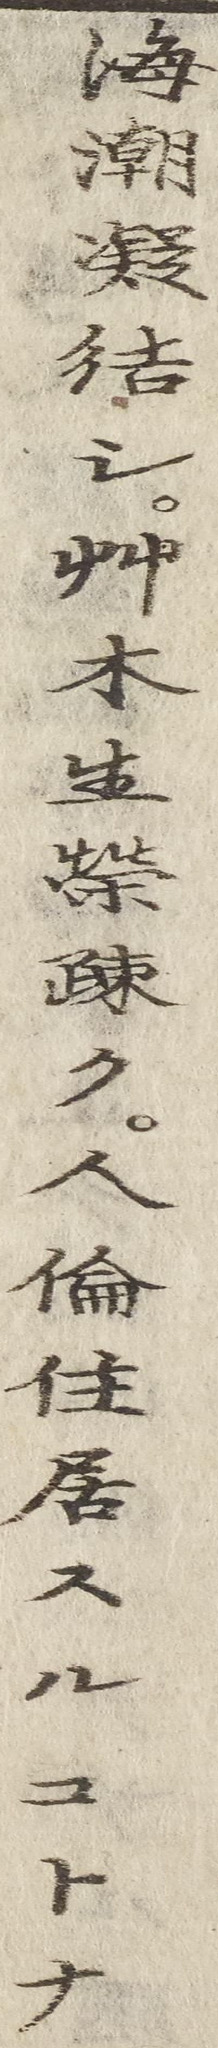海潮凝結シ。草本生栄疎ク。人倫住居スルコトナ
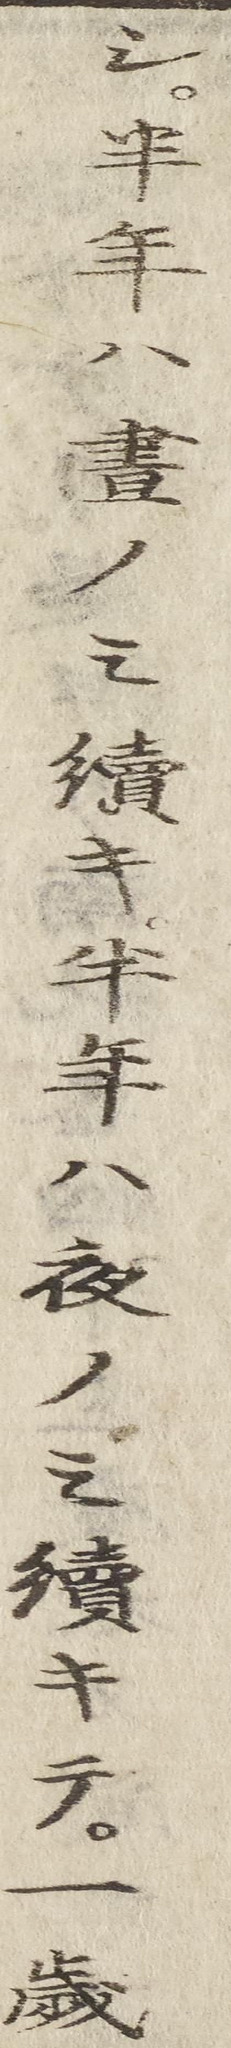シ。半年ハ昼ノミ続キ半年ハ夜ノミ続キテ。一歳
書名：大略天学名目鈔　天經或問附録
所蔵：東京大学地震研究所図書室 Earthquake Research Institute Library, The University of Tokyo, JAPAN
